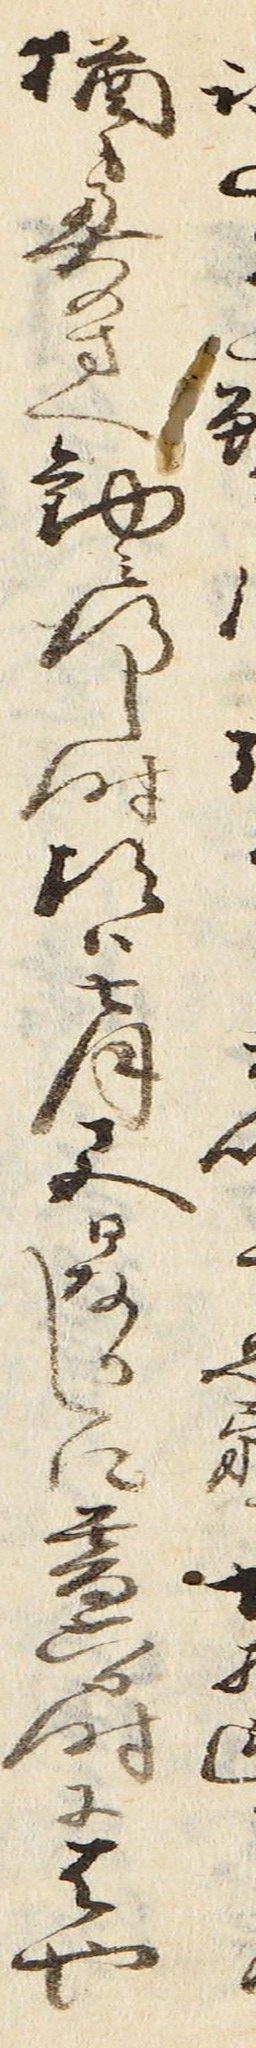猶も奥の方へ勧ミ行し時頃ハ七月十五日なりしに暮六ツ時にはや
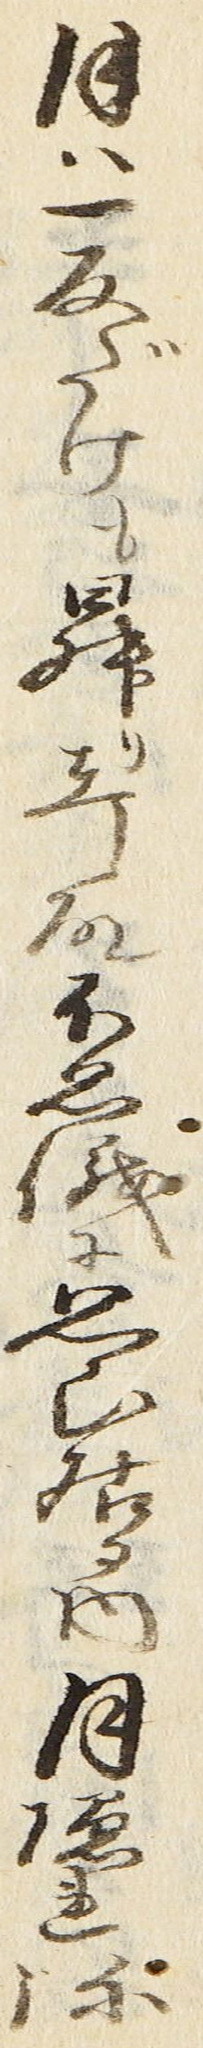月ハ一反だけも昇り在し故不思儀に思ひ居る内月隠れ弥
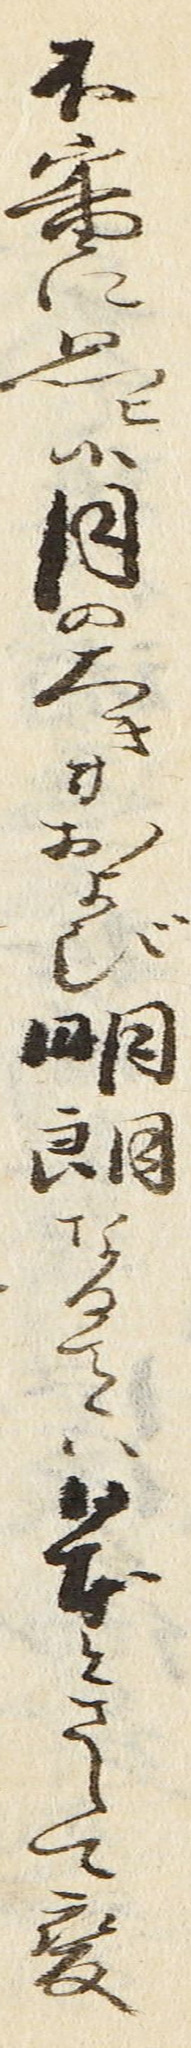不審に思ヒ候月の大キサおよび明朗なることハ日本とさして変
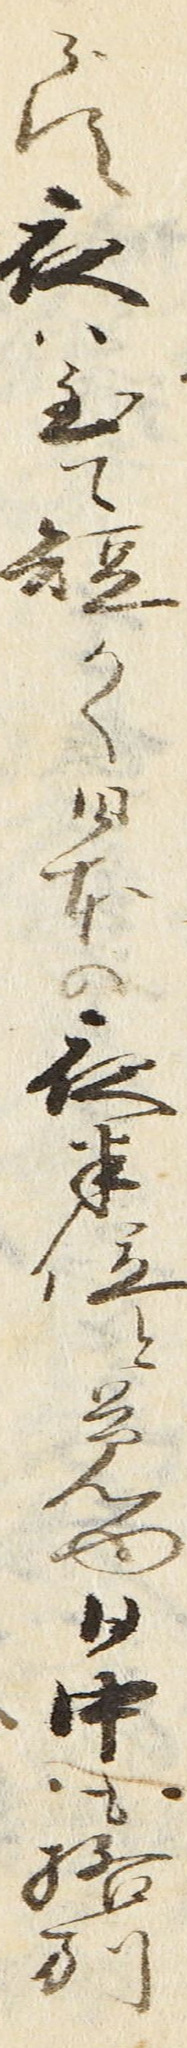らす夜ハ至て短かく日本の夜半位と覚ゆ日中も格別
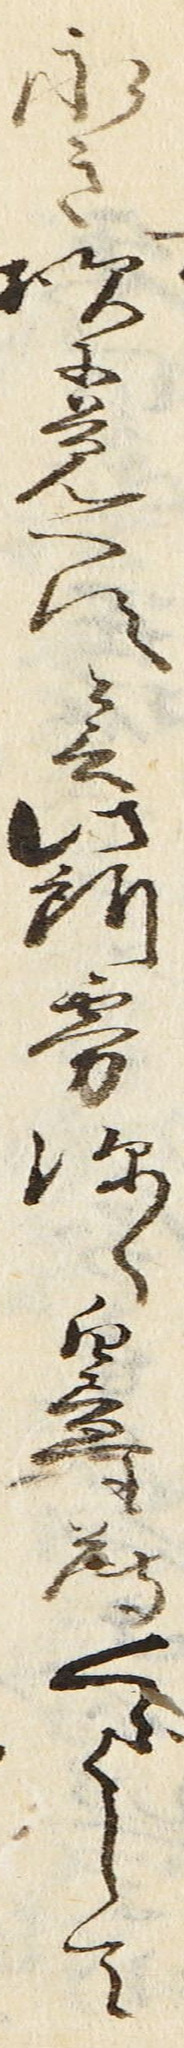永き様子覚へすと云此所雰深く白昼も薄くらくして
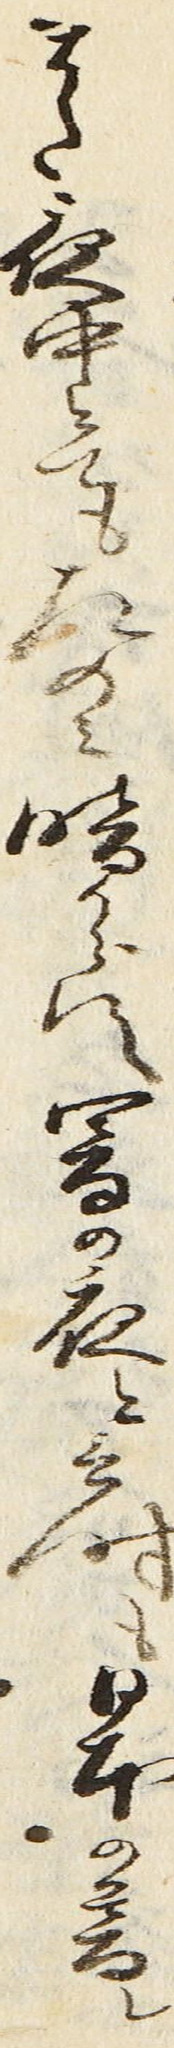また夜中とても左のミ暗からす闇の夜と云時も日本の暮レ
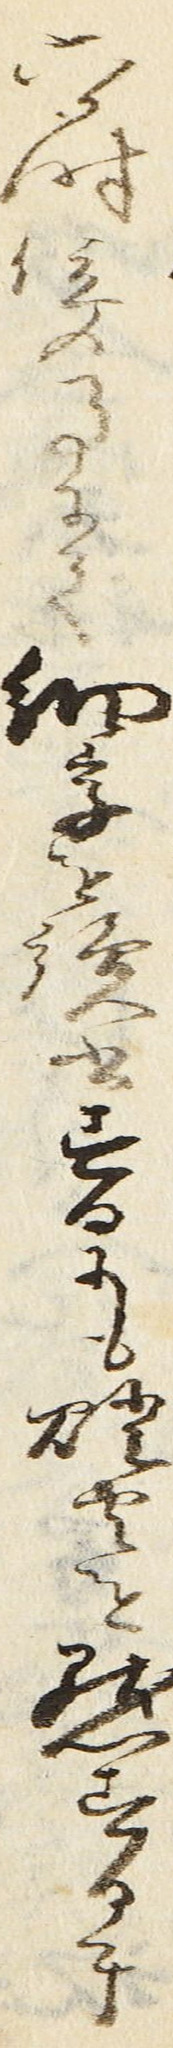六ツ時位の事にて細字を読書するにも燈りを点するに
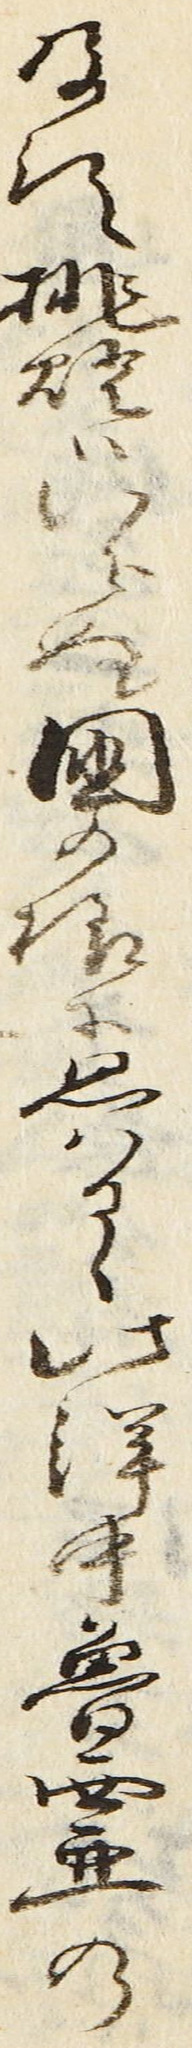及す挑燈ハいらぬ国の様に思ハるゝ此洋中魯西亜の
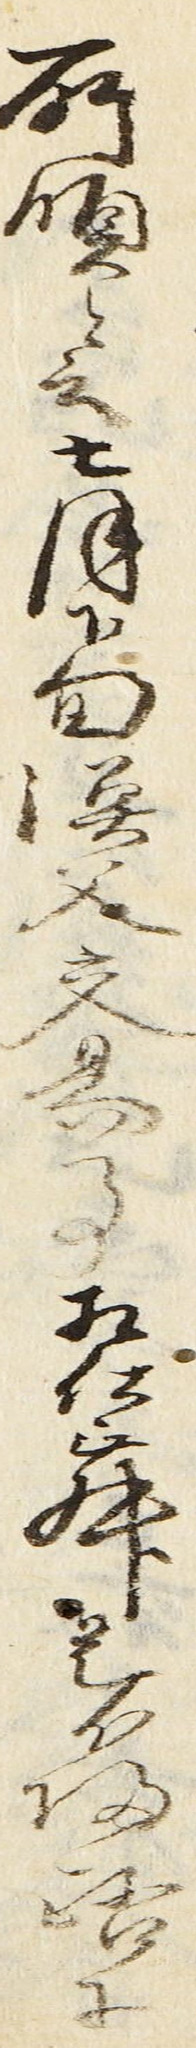所領と云七月下旬漁父交易事相仕舞是ゟ帰路に
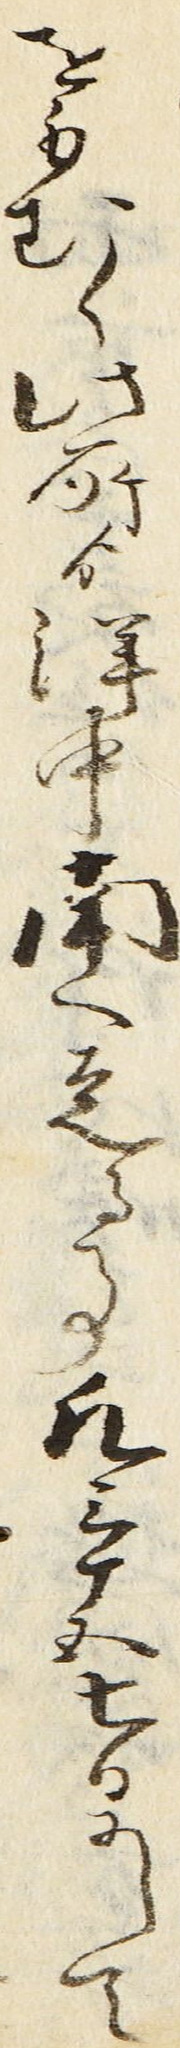をもむく此所ゟ洋中南へ走る事凡三十五七日にして
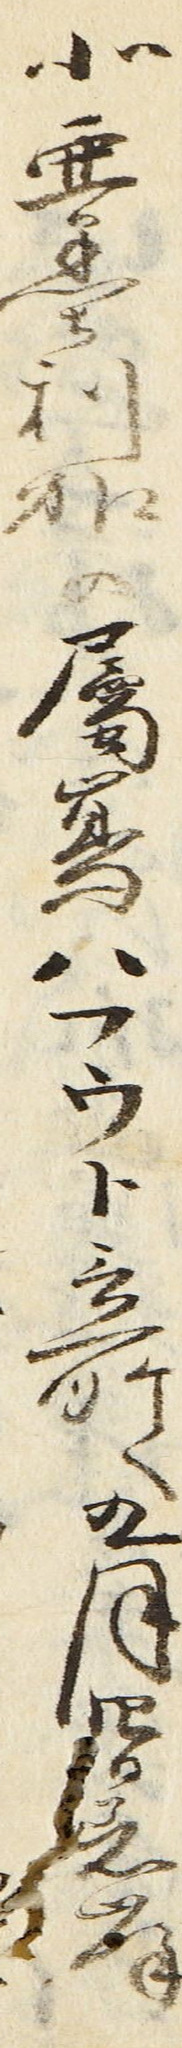北亜墨利加の属島ハフウト云所へ九月四日着岸
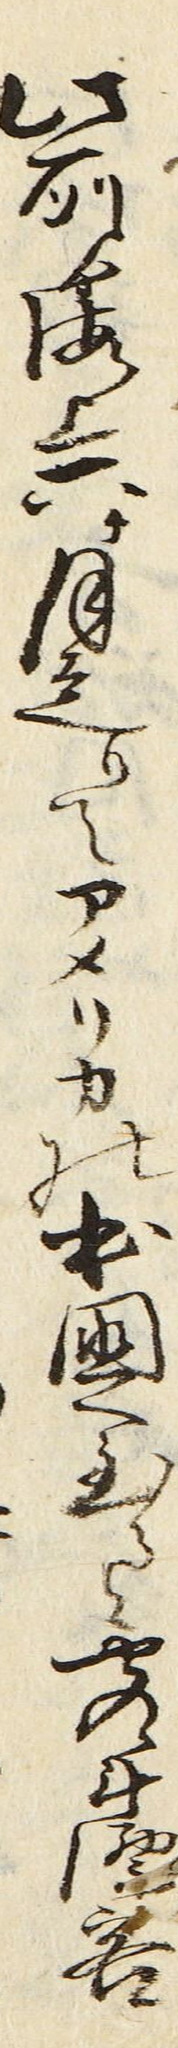此所海上六ケ月走りてアメリカの本国へ至ると聞計漂客
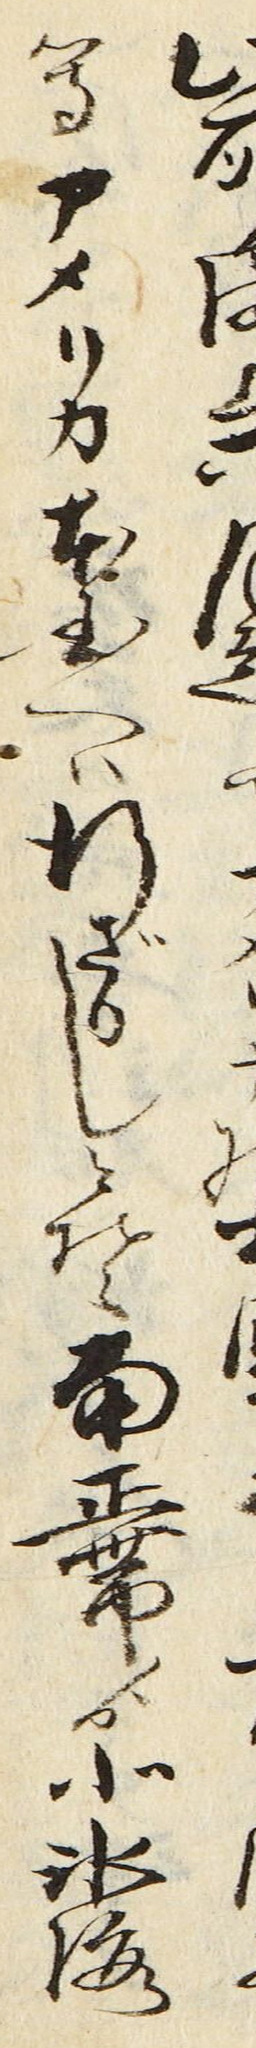等アメリカ本国へハ行ざりしとそ南正帯ゟ北氷海

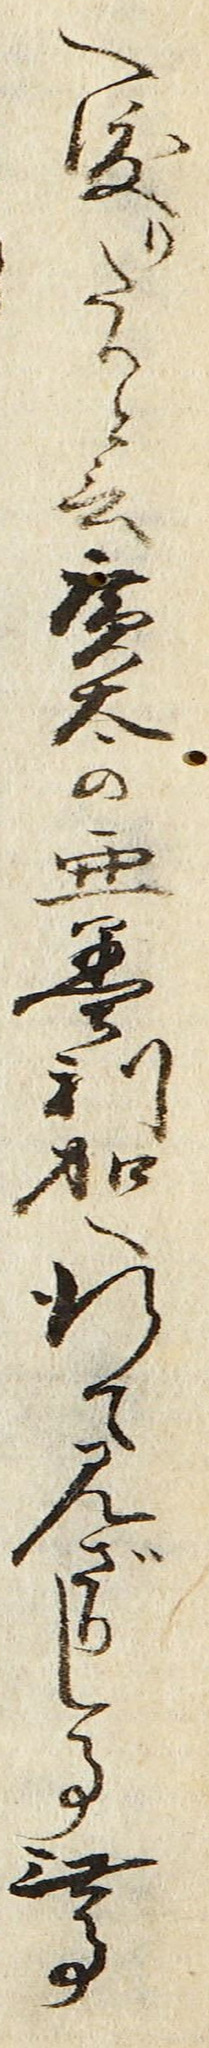へ渡りたりと言広太の亜墨利加へ行て見ざりし事無事
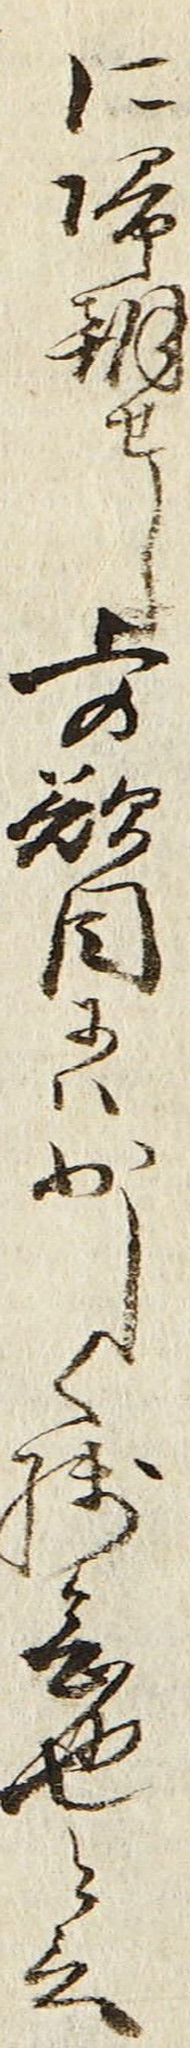に帰朝せし上の歎目にハ少しく残念也と言
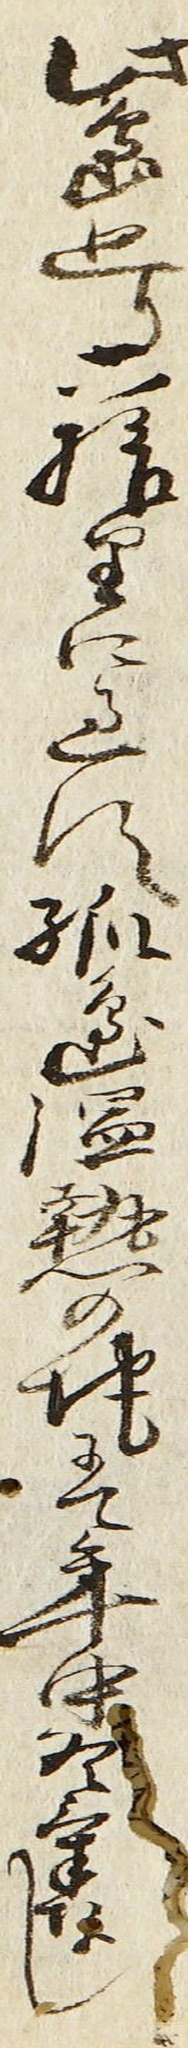此島廻り六拾里に過す孤島温熱の地にて年中冬気なし
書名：亜墨利加漂流記聞
